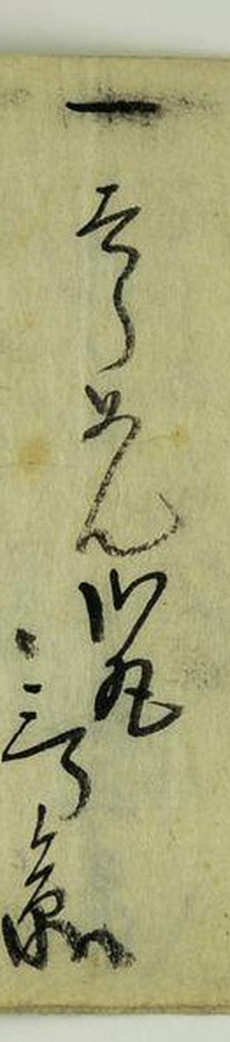一そうめん弐丸三郎兵衛
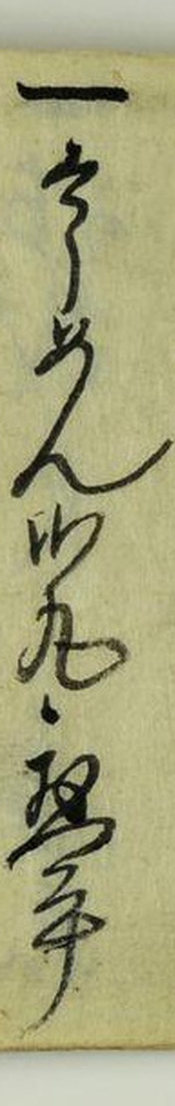一そうめん弐丸惣平
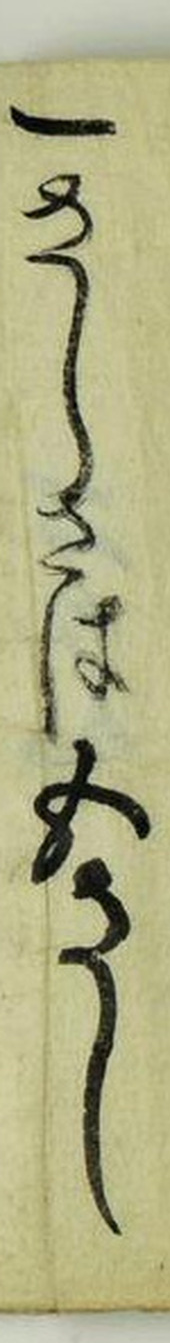一さしさば五さし

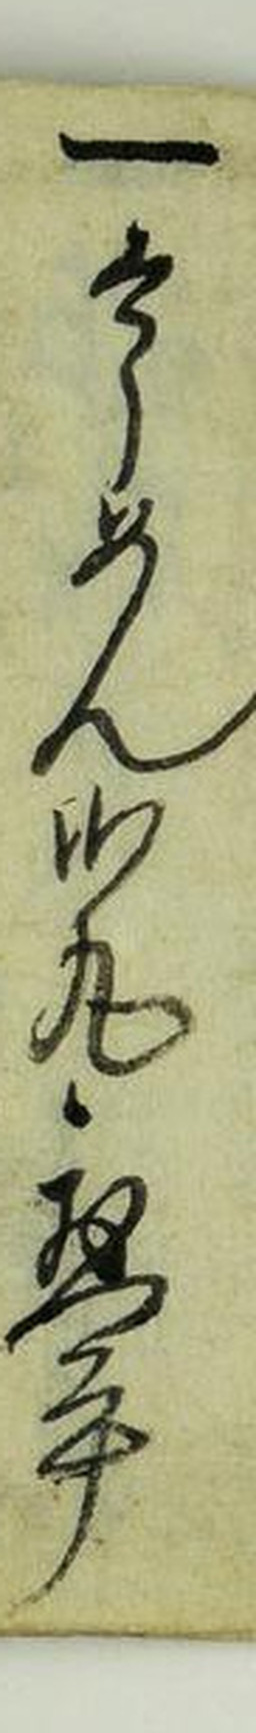一そうめん弐丸惣平
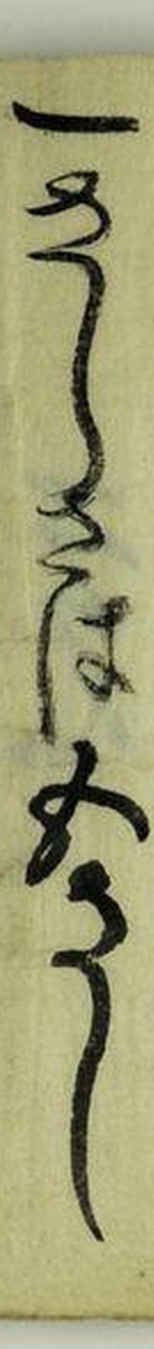一さしさは五さし
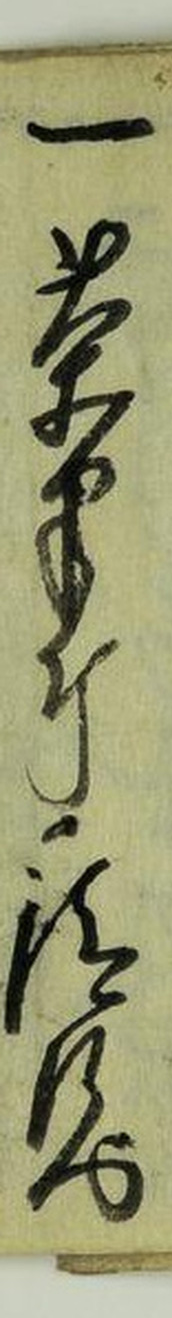一茶半斤清左衛門
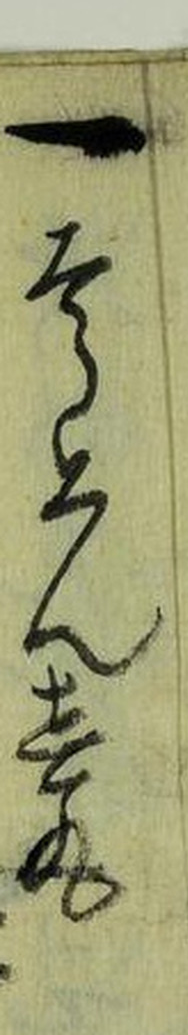一そうめん弐丸
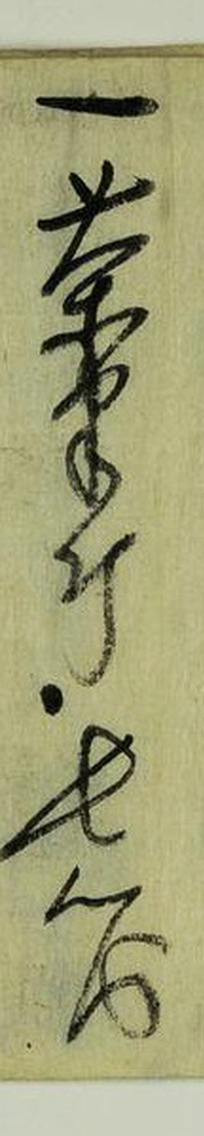一茶半斤長右衛門
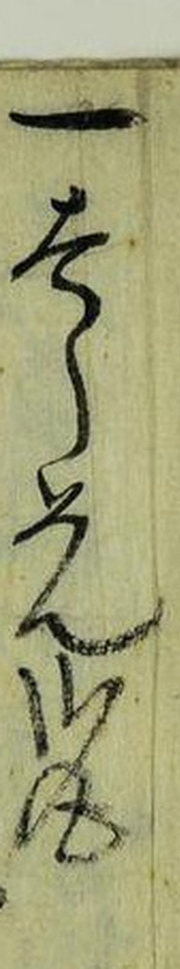一そうめん弐丸
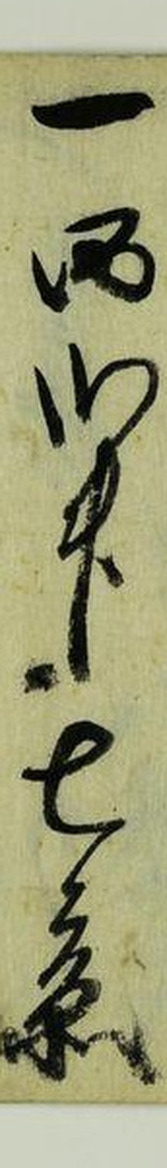一酒弐升七兵衛
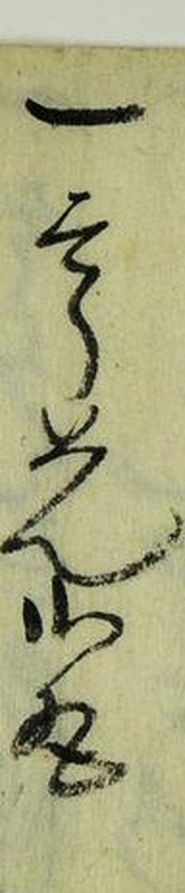一そうめん弐丸

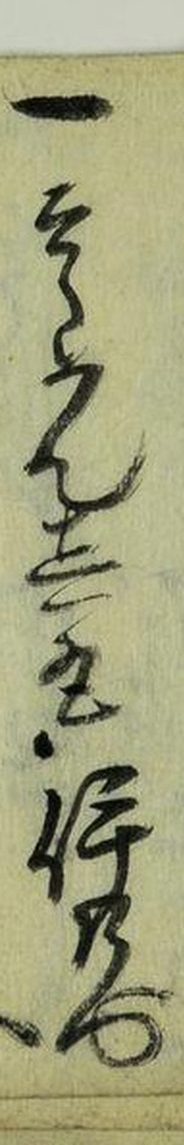一そうめん壱丸伊左衛門
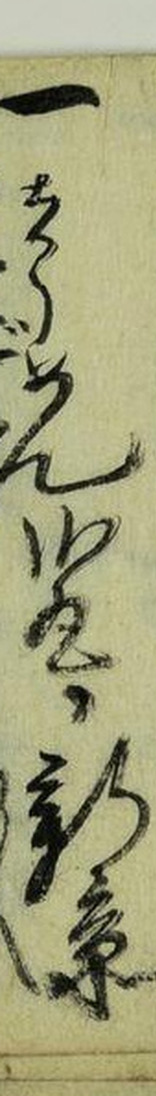一そうめん弐丸新兵衛
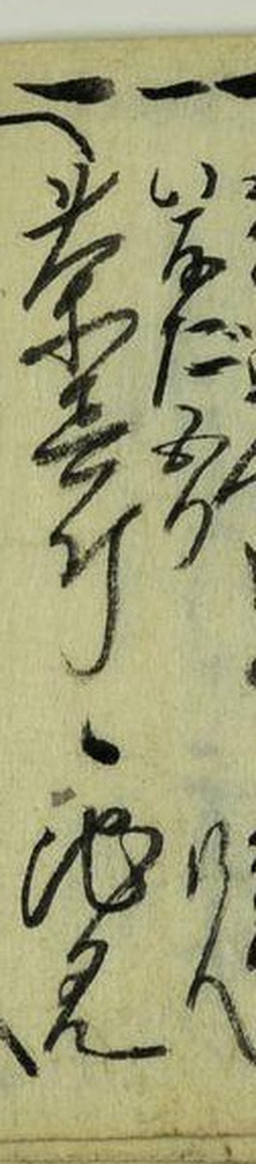一茶壱斤池見
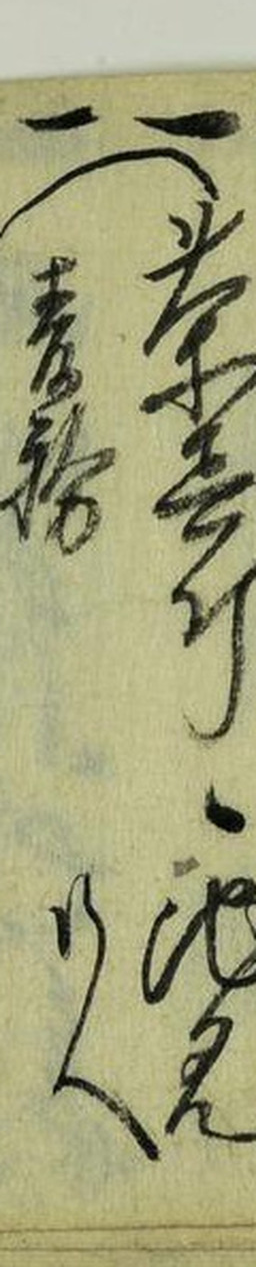一麦粉同人
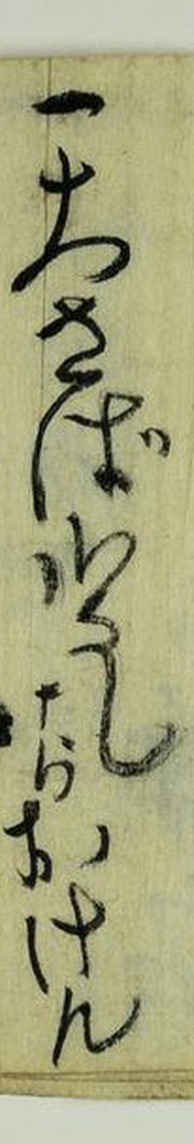一大さば弐さし十らおけん
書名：松五郎参宮はなむけ并留守見舞
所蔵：福井県文書館 Fukui Prefectural Archives
